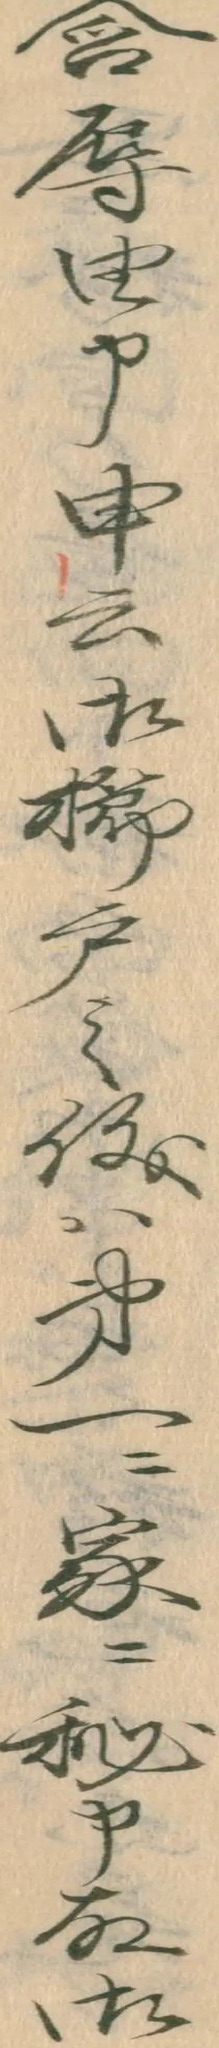含辱由申申_云御櫛戸之儀ハ第一ニ家ニ秘申故御
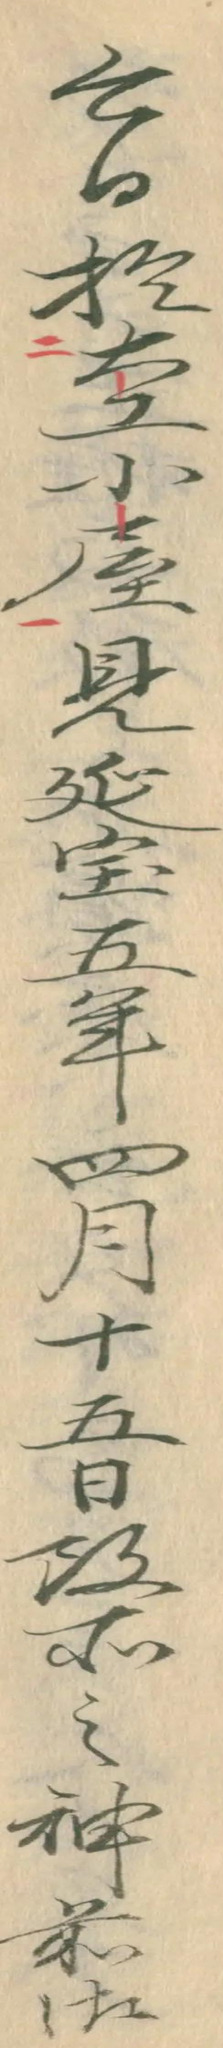一今日於大-工小-屋見延宝五年四月十五日改所之神前御
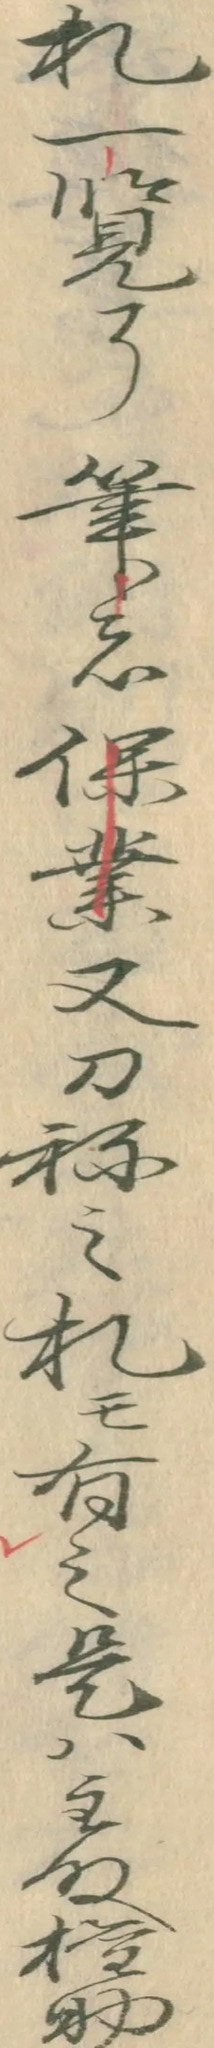札一-覧了筆-者保業又刀祢之札モ有之是ハ主殿権助

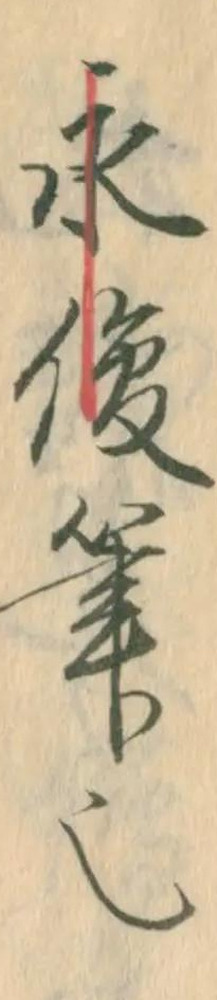永俊筆也
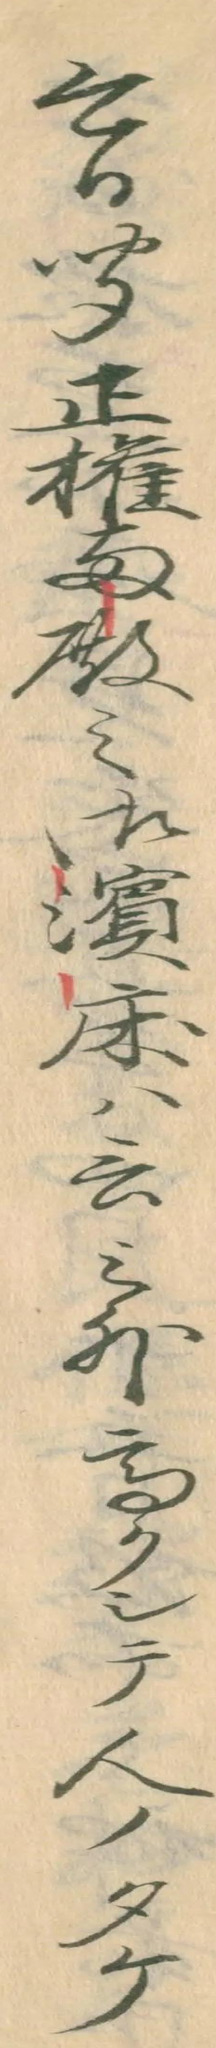一今日聞正権両-殿之御_浜_床ハ云之外高クシテ人ノタケ
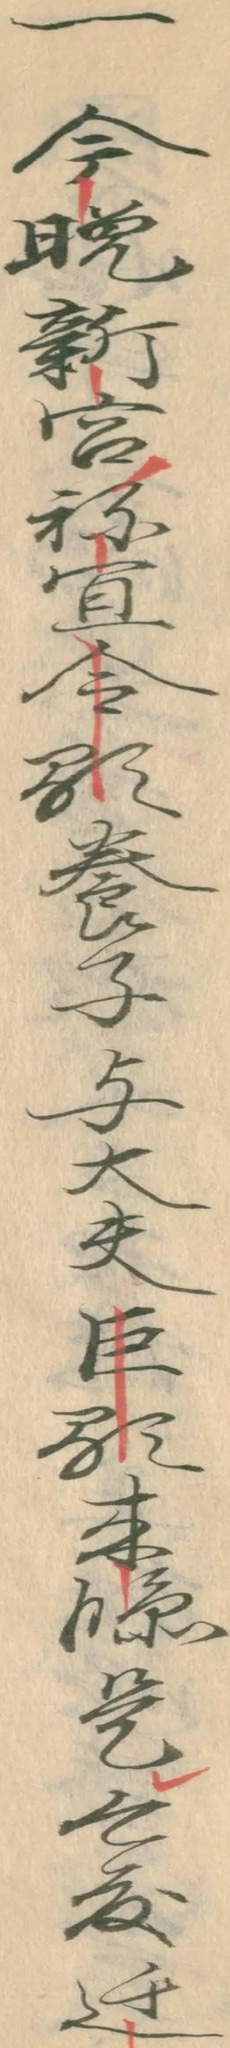一今-晩新-宮祢-宜令顕養子与大夫巨顕来-臨是今度迁-
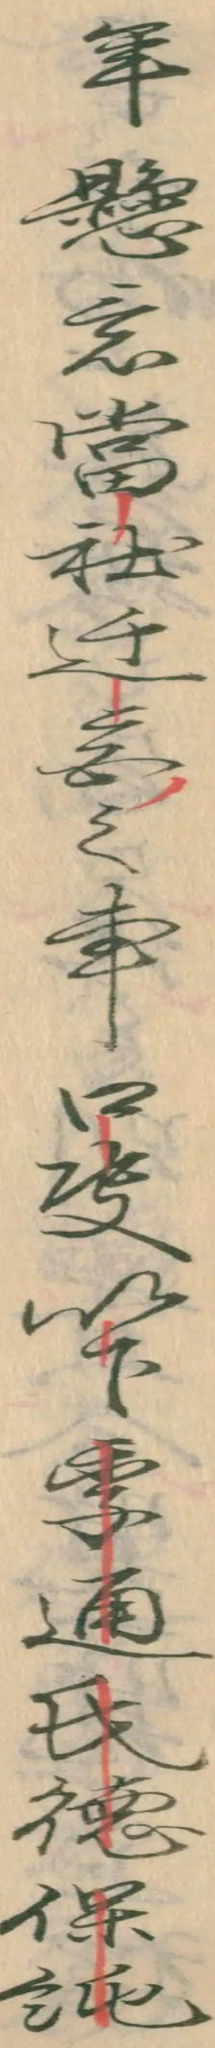年懸意当-社迁-宮之事口-決以-下季通氏徳保純
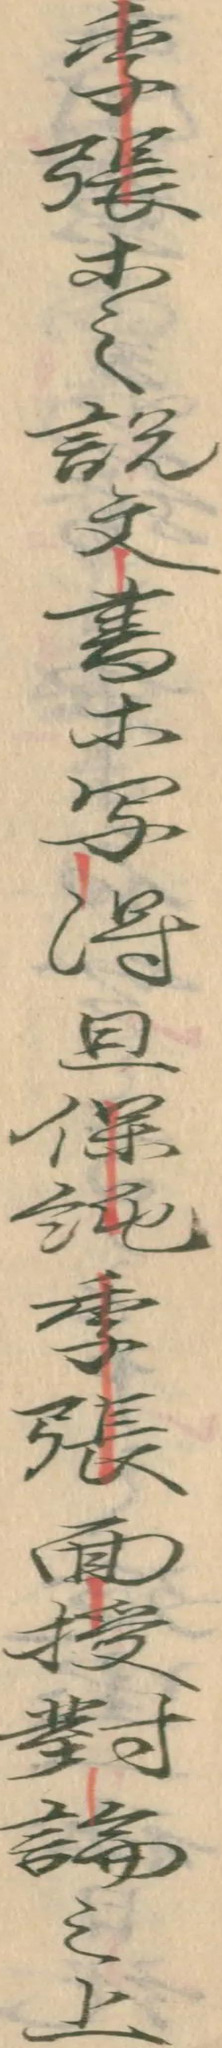季張等之説文-書等写_得且保純季張面-授対-論之上
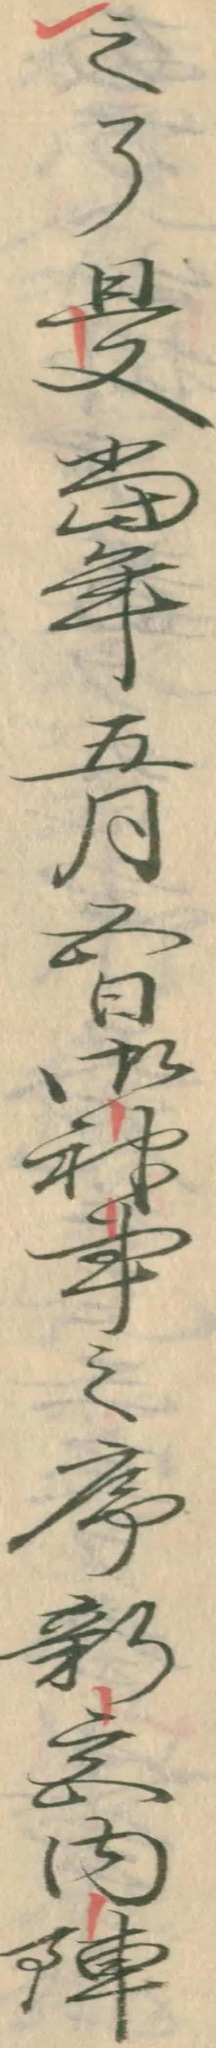之了且_又当年五月五日御-神-事之序新-宮内-陣
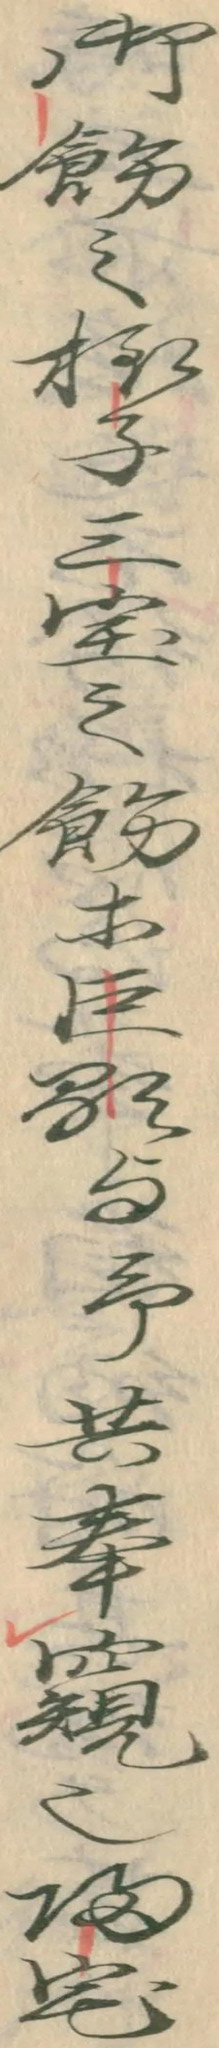御_錺之様-子三-宝之錺等巨顕与予共奉窺也帰-宅

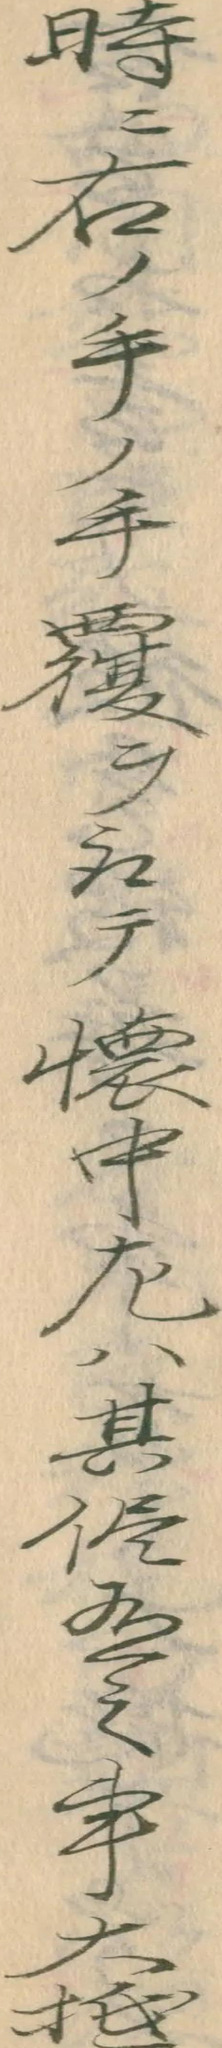時ニ右ノ手ノ手覆ヲ取テ懐中左ハ其侭有之事大抵
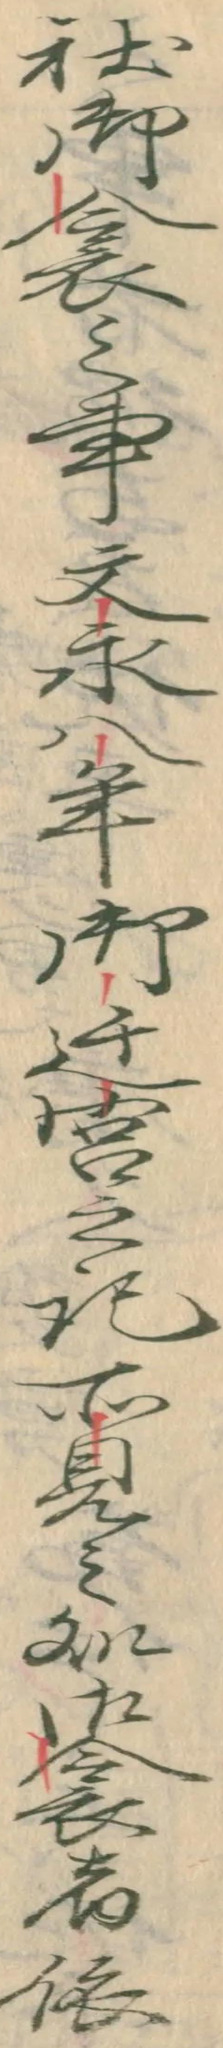社御_衾之事文-永八-年御-迁-宮之記所-見之処御_衾者依

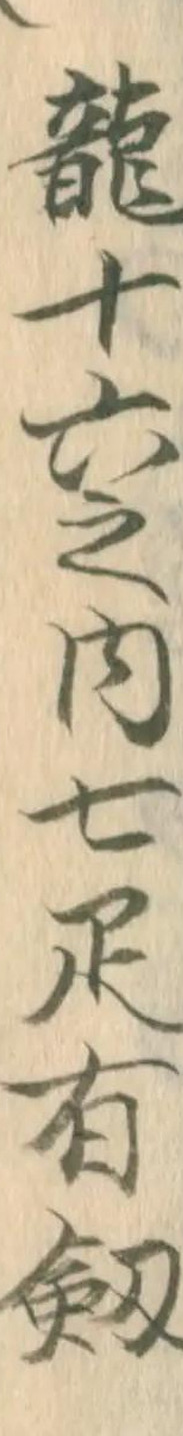龍十六之内七疋有剱

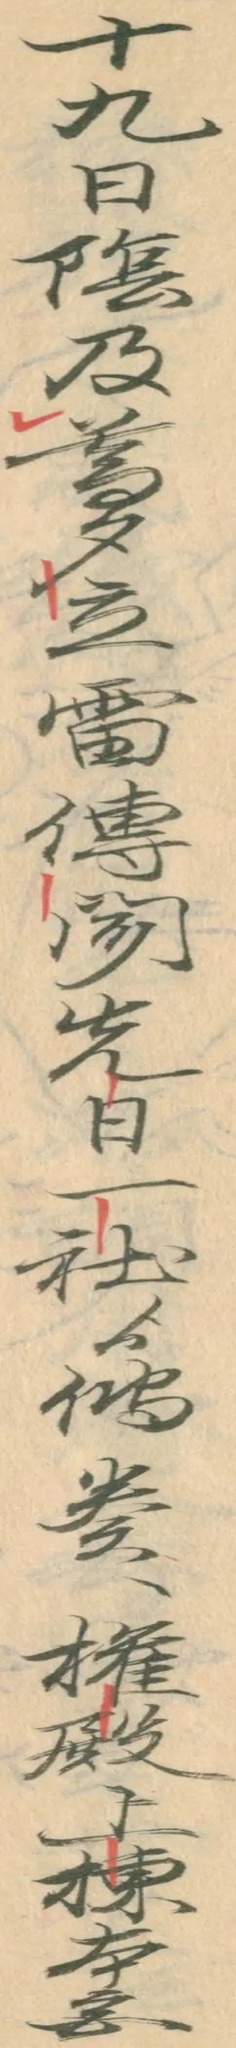十九日陰及暮夕_立雷伝_聞先-日一-社ゟ伝奏へ権-殿上-棟本宮
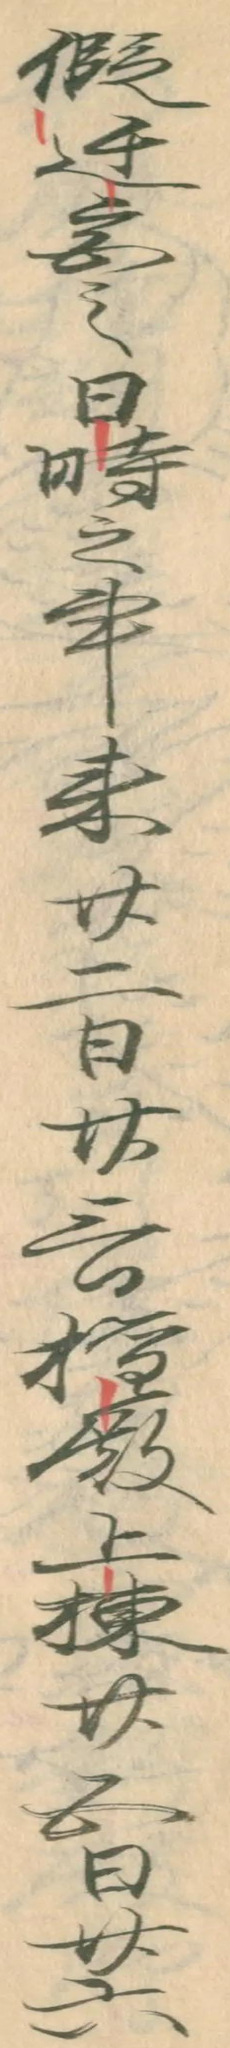仮_迁-宮之日-時之事来廿二日廿三日權-殿上-棟廿五日廿六
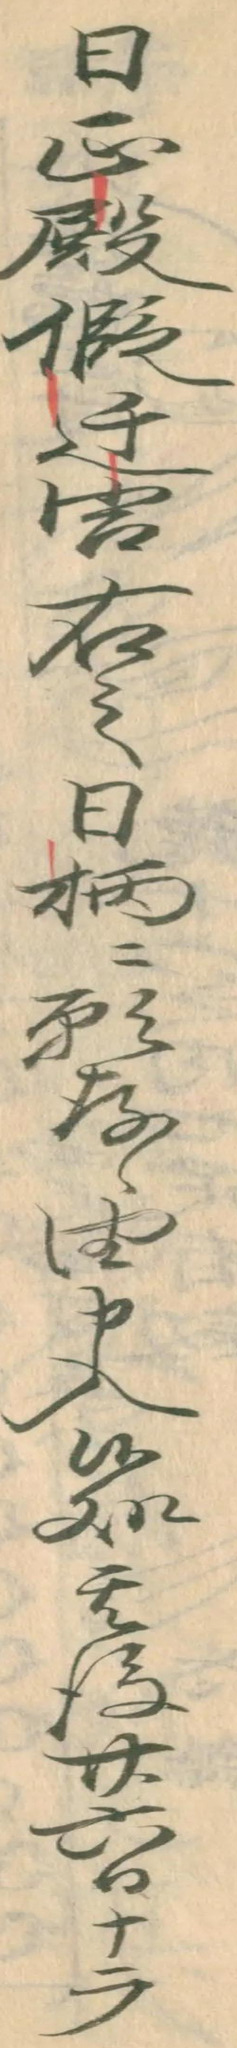日正-殿仮_迁-宮右之日_柄ニ願存候由申入候処其後廿六日ナラ
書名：賀茂社記録. 第15冊
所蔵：国立国会図書館 National Diet Library, JAPAN
